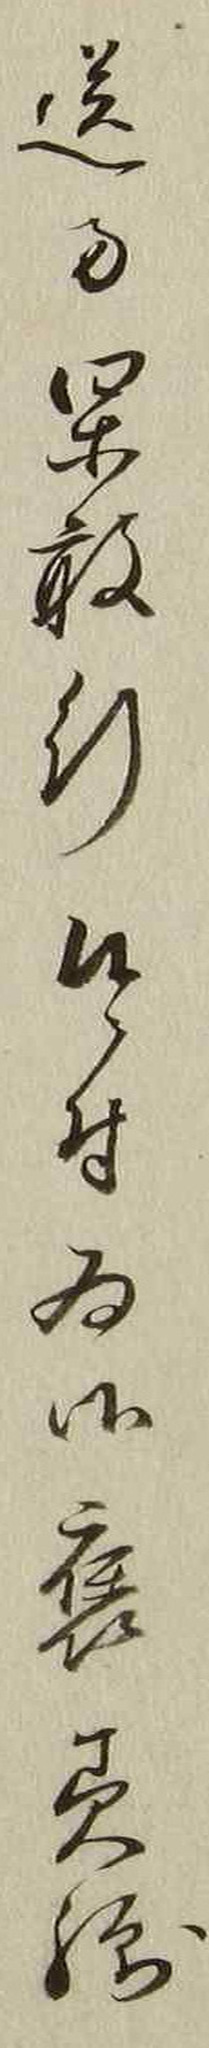送方果敢行候ニ付為御褒美綿
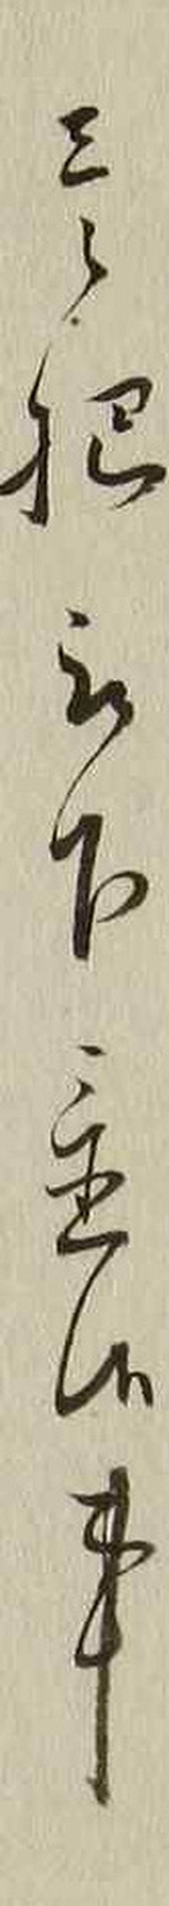壱把被下置候事
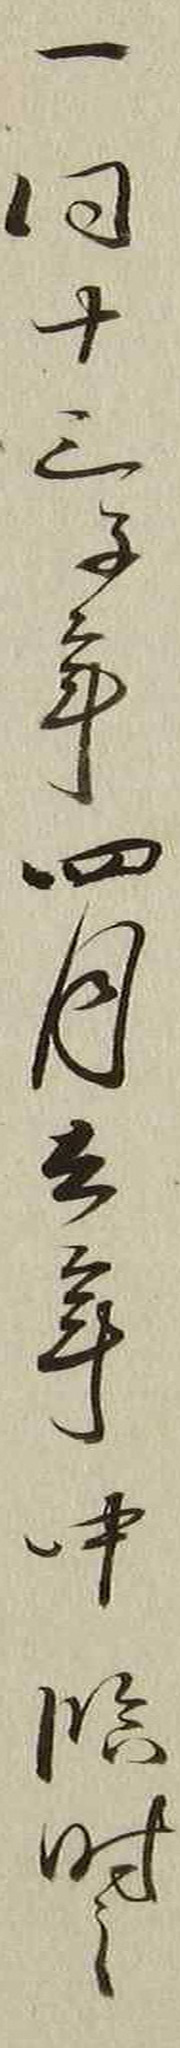一同十三子年四月去年中臨時之
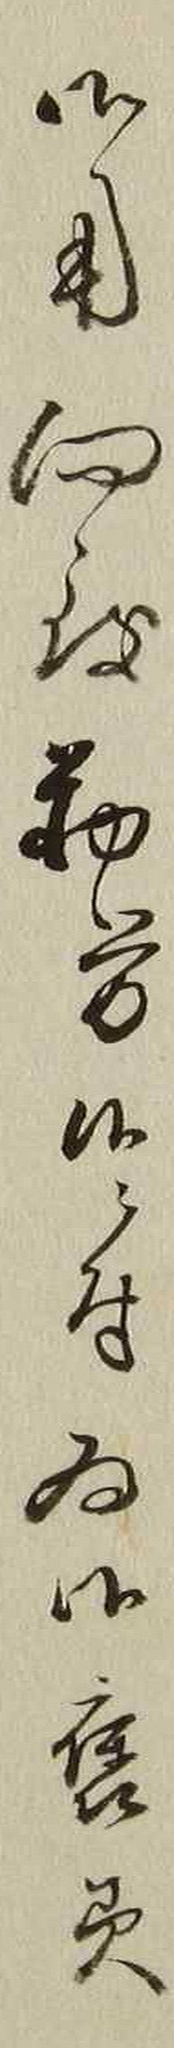御用向致勤労候ニ付為御褒美
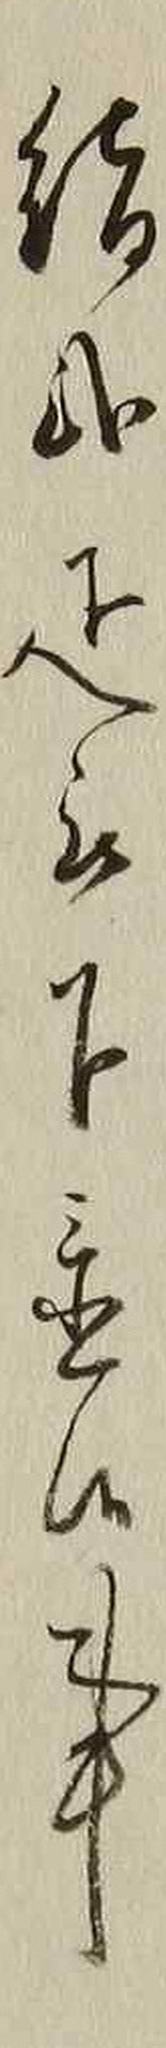絹弐疋被下置候事
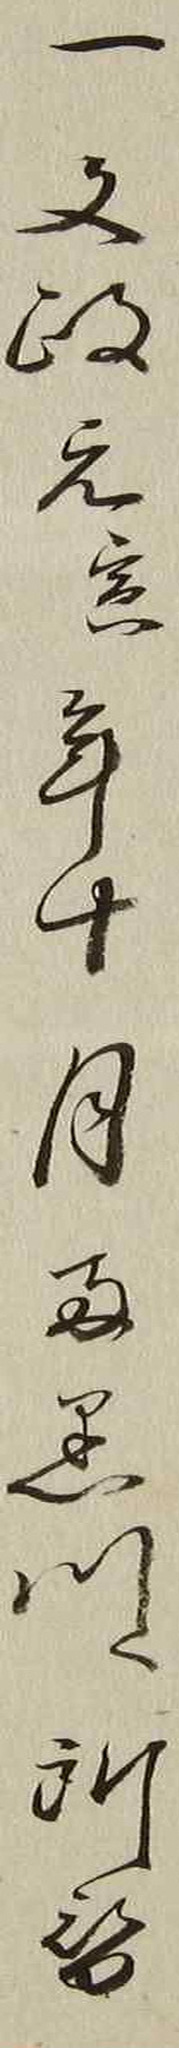一文政元寅年十月両黒川へ所替
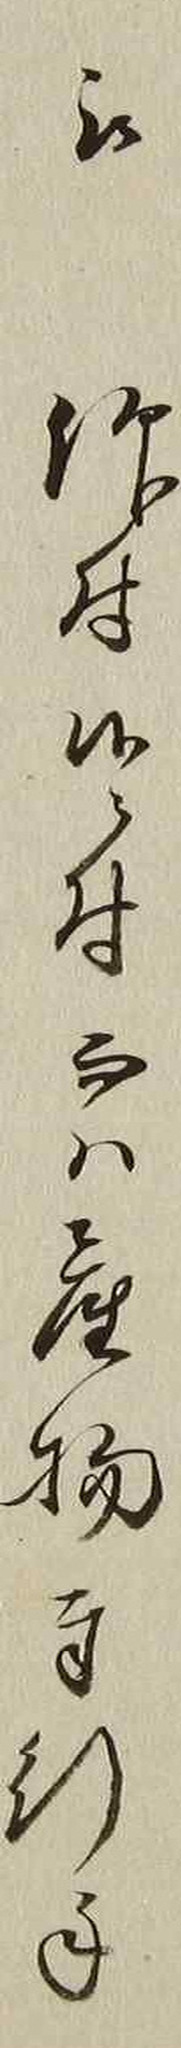被仰付候ニ付而ハ産物奉行手
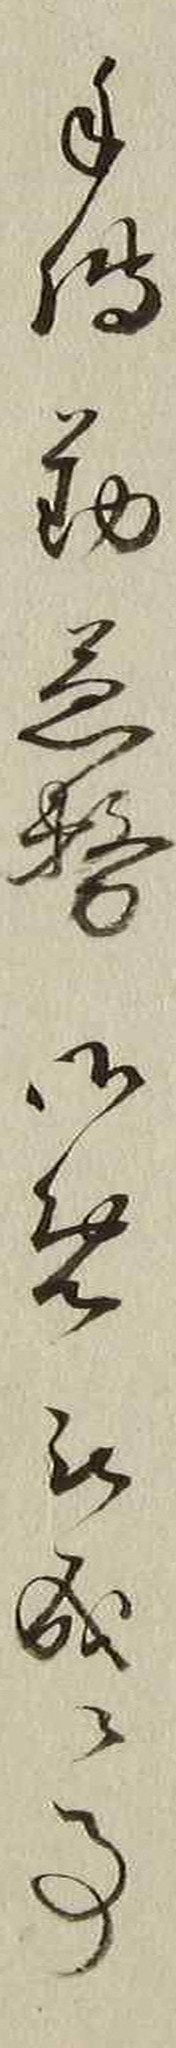手伝勤兼務御免被成候事
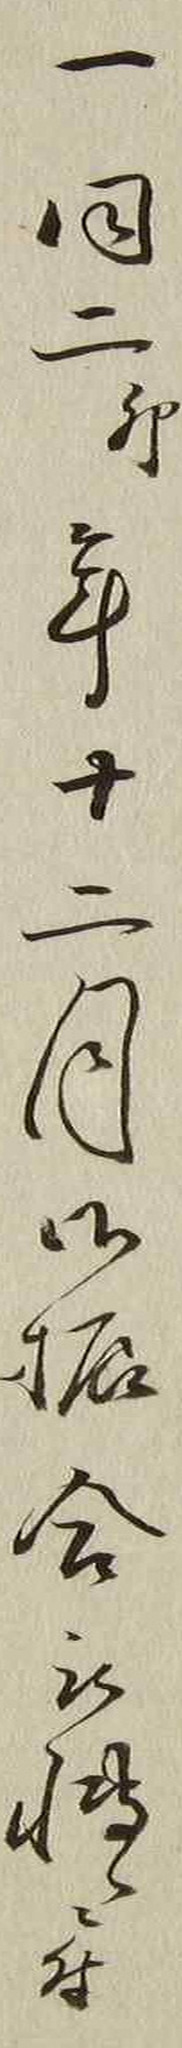一同二卯年十二月御振合被転候ニ付
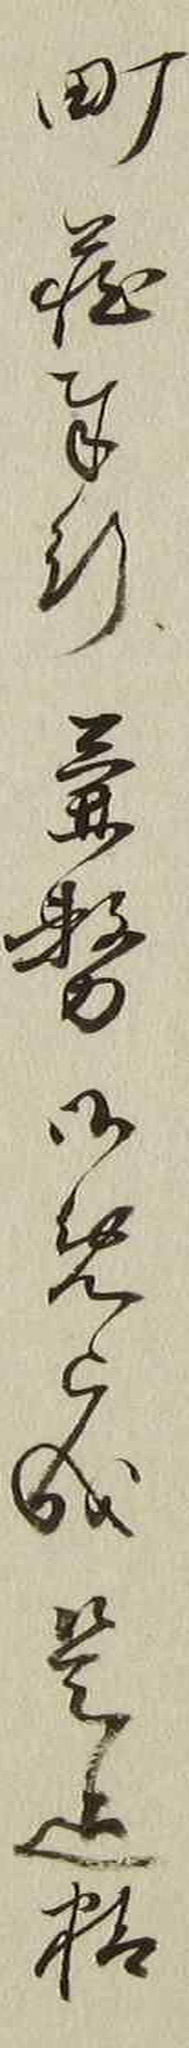町蔵奉行兼務御免被成是迄精
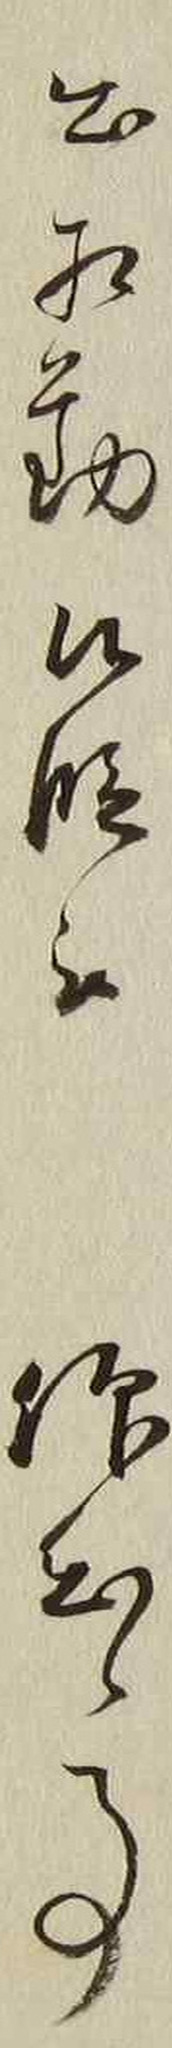出相勤候段被仰出候事
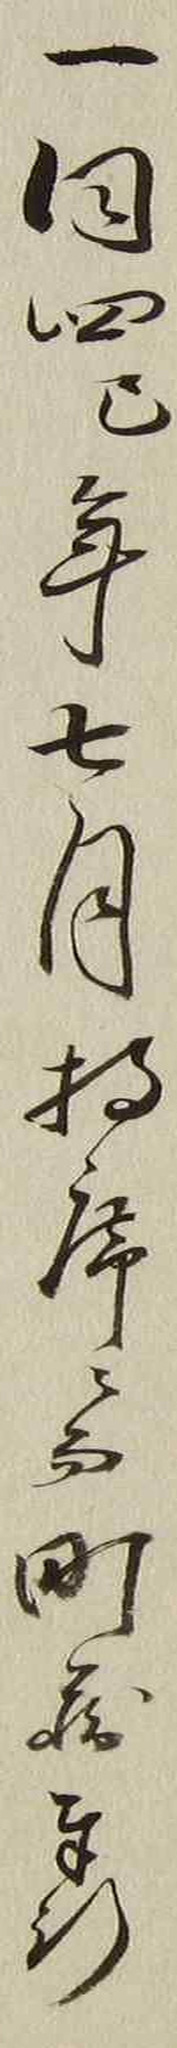一同四巳年七月持席ニ而町蔵奉行
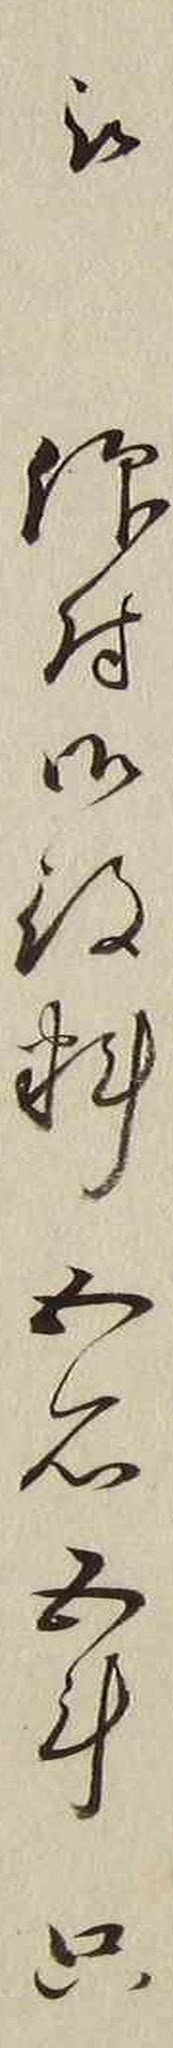被仰付御役料五石五斗只
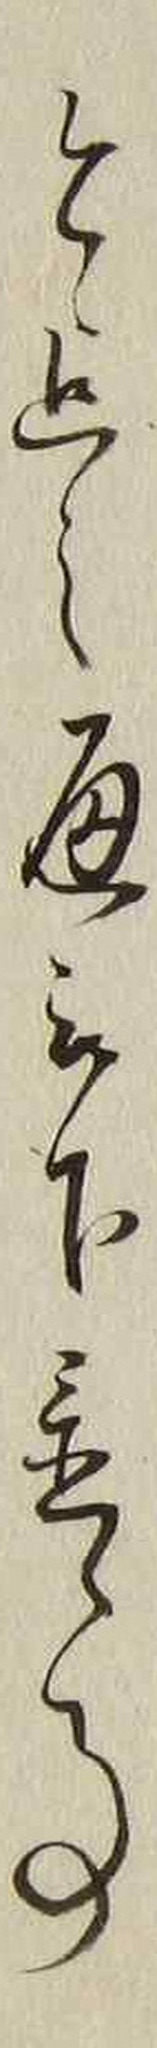今迄之通被下置候事
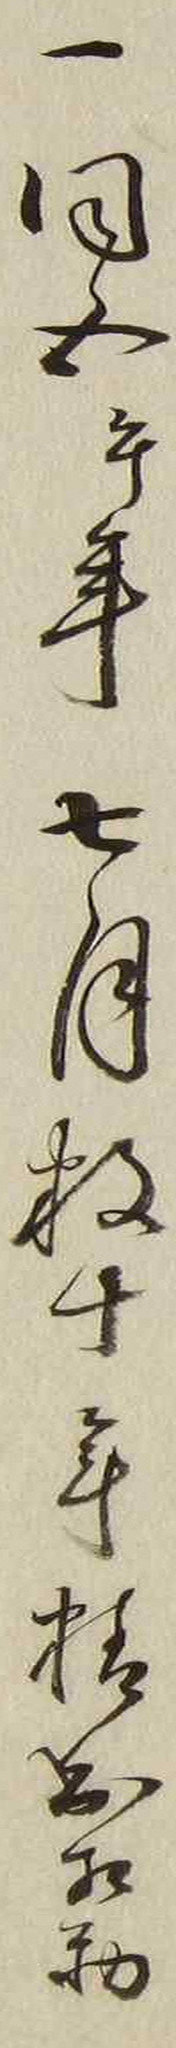一同五午年七月数十年精出相勤

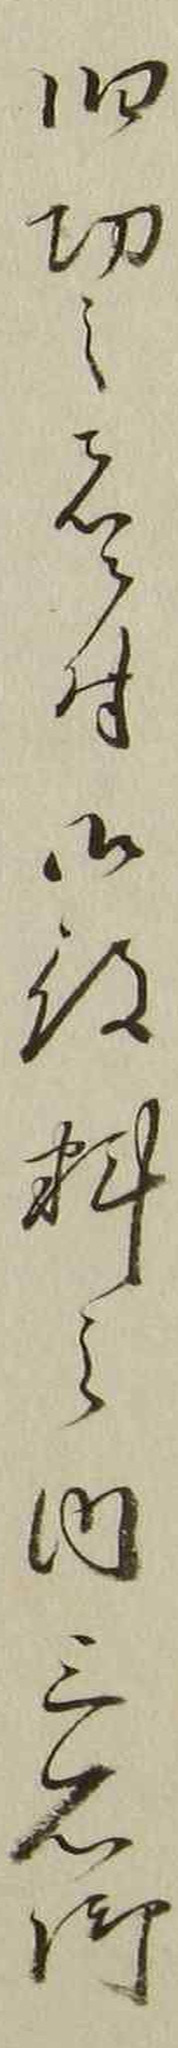旧功之者ニ付御役料之内三石御
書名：諸士系譜　巻之52　に之部3
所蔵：会津若松市立会津図書館
